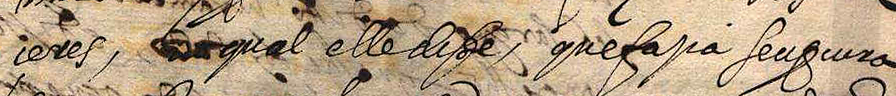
çeres, o qual elle disse, que fazia seu ꝓcura
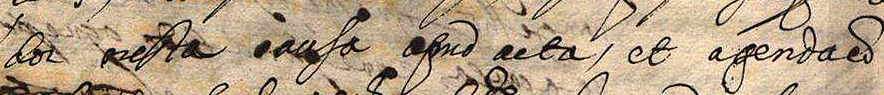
dor nesta causa apud acta, et agenda cō
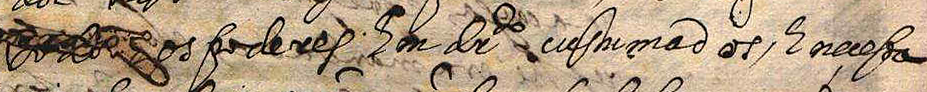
_ os poderes Em drto custumados, E neçessa
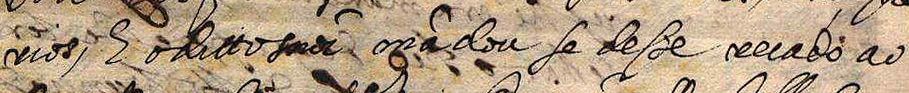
rios, E o ditto snor̄ mādou se desse recado ao
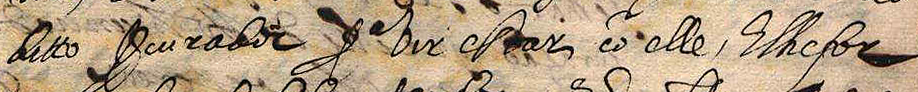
ditto ꝓcurador ꝑ vir estar cō elle, E lhe por
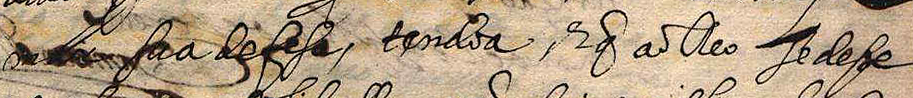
nella sua defesa, tendoa, E q̄ ao Reo se desse
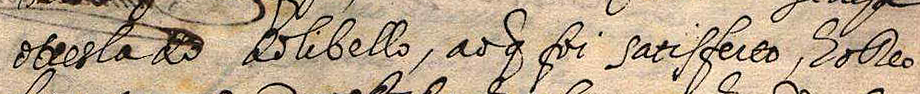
o treslado do libello, ao q̄ foi satisfeito, E o Reo
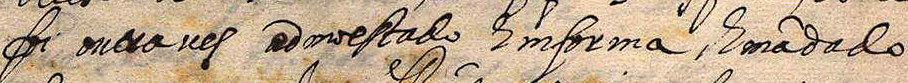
foi outra ues admoestado Em forma, E mādado
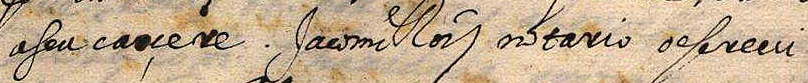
a seu carçere. Jacome Roīz notario o escreui
